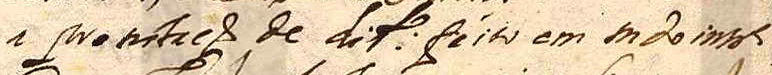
a protestaçaõ de dir.to feito em tudo intro.
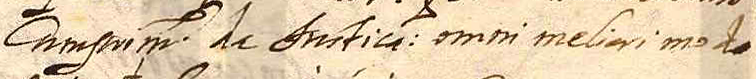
Cumprim.to da Iustiça: omni meliori modo
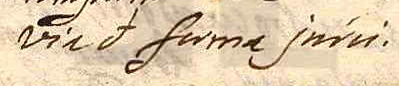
via et̄ forma juris.
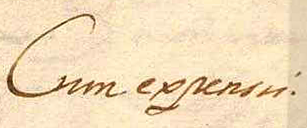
Cum expensis.
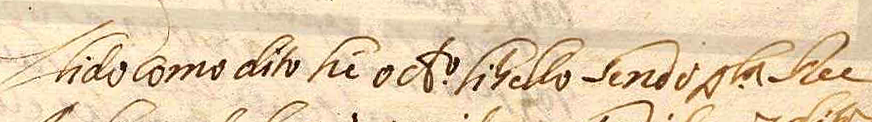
E lido como dito hé o d̄.o libello sendo p.la Ree
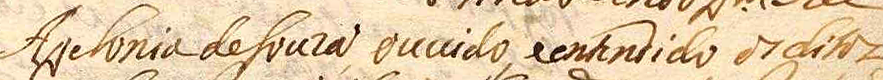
Apelonia de souza, ouuido, e entendido os ditos
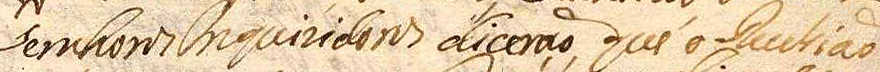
senhores Inquizidores diceraõ, que o Recebiaõ
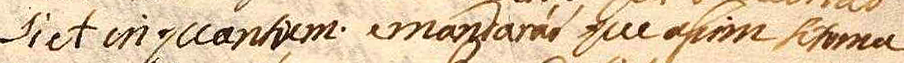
si et in quantum. e mandarão que assim se toma
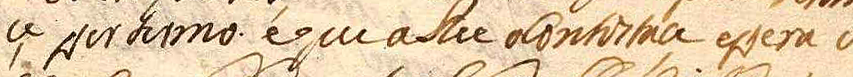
çe por termo. e que a Ree o contestace e pera o
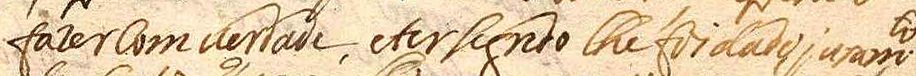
fazer com uerdade, e ter segredo lhe foi dado juram.to
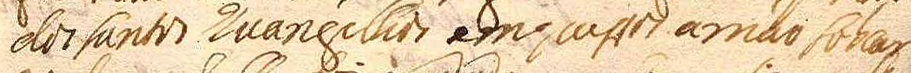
dos santos Euangelhos em que pos a mao sob car
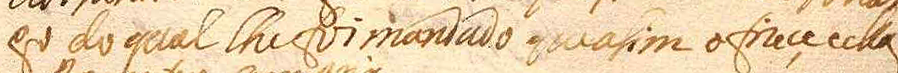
go do qual lhe foi mandado que assim o fizeçe e ella
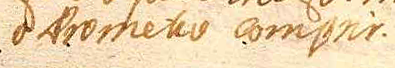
o Prometeo comprir.
